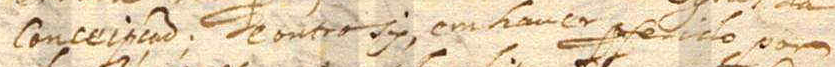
conceipçaõ; e outrosy, em hauer ꝓferido para
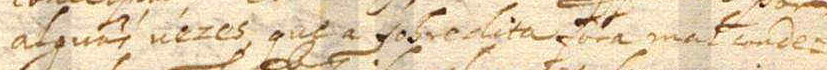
alguās uezes, que a sobredita fora mal conde
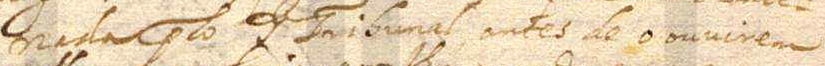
nada plo sto Tribunal antes de o ouuirem
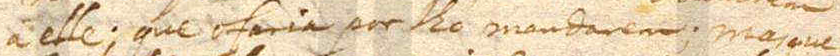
a elle; que o faria por lhe mandarem; mas oue
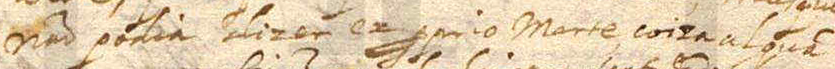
naõ podia dizer ex ꝓprio morte coiza alguā
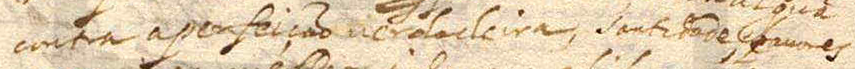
contra a perfeiçaõ uerdadeira, santidade, prumes
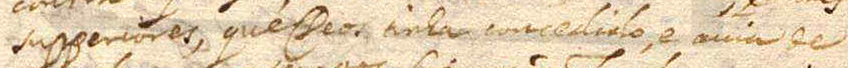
supperiores, que Deos tinha concedido, e auia de
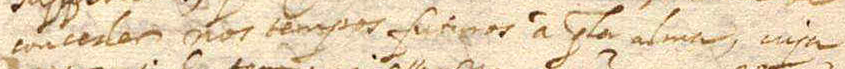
conceder nos tempos futuros à pla alma, cuja
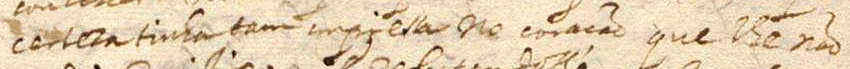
certeza tinha tam impressa na criaçaõ que lhe não
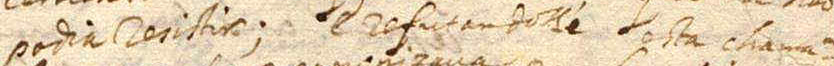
podia Resistir; e Refutandosse desta chama
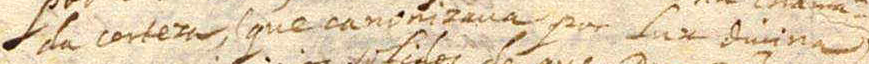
da certeza, (que canonizaua por sua diuina)
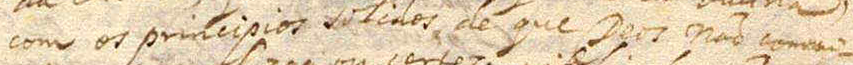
com os principios solidos de que Deos naõ commu
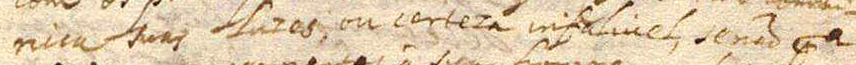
nica suas luzes, ou certeza infaliuel, senaõ pa
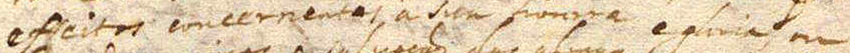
effeitos concernentes à sua honrra e gloria, ou
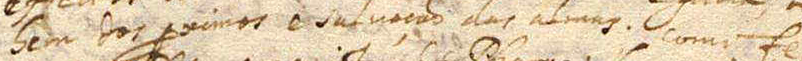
bem dos ꝓximos e saluaçaõ das almas; como fes á
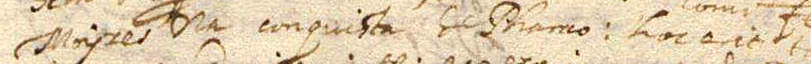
Moyzes na conquista de Pharreo: hoc erit tibi
